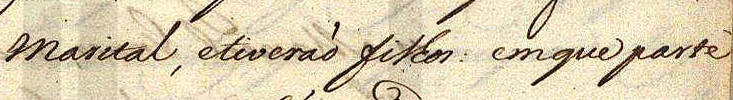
marital, e tiveraõ filhos: em que parte
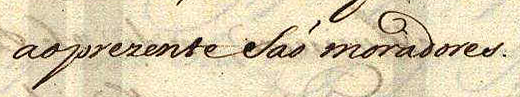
ao prezente Saõ moradores.
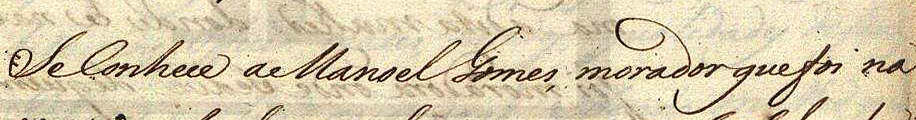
Se Conhece a Manoel Gomes, morador que foi na
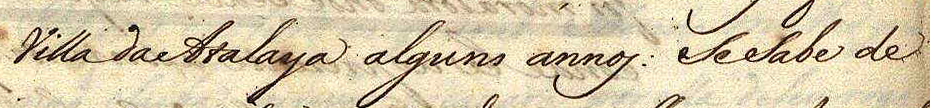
Villa da Atalaya alguns annos: Se Sabe de
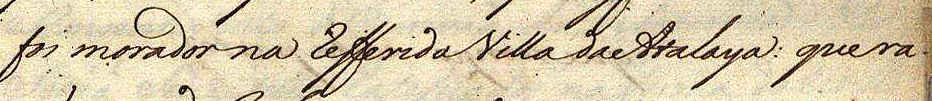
foi morador na Refferida Villa da Atalaya: que ra
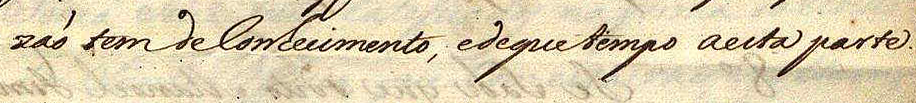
zaõ tem de Conhecimento, e de que tempo a esta parte.
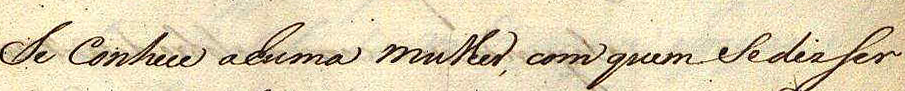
Se conhece a huma mulher, com quem Se diz ser
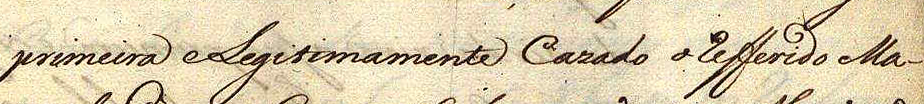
primeira e Legitimamente cazado o Refferido Ma
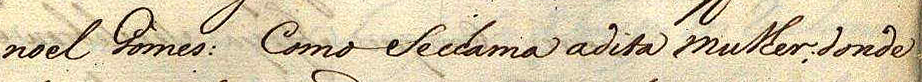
noel Gomes: Como se chama a dita mulher; donde
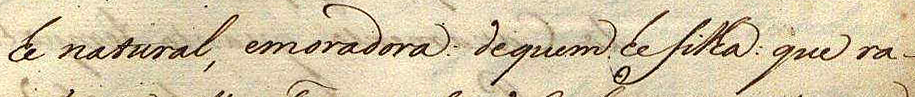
he natural, e moradora. de quem he filha: que ra
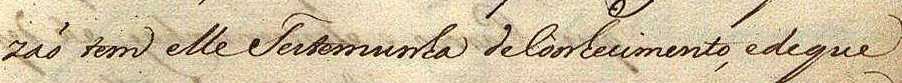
zaõ tem elle Testemunha de Conhecimento, e de que
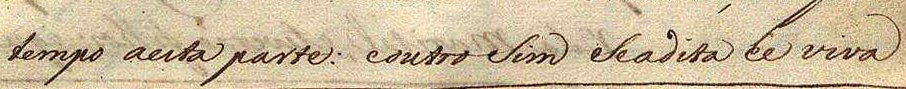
tempo a esta parte: e outroSim Se a dita he viva
